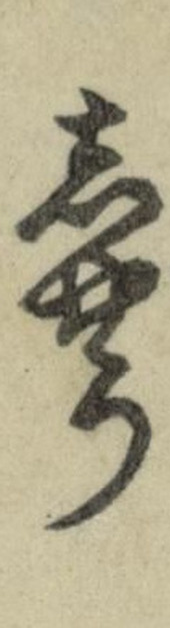しやう
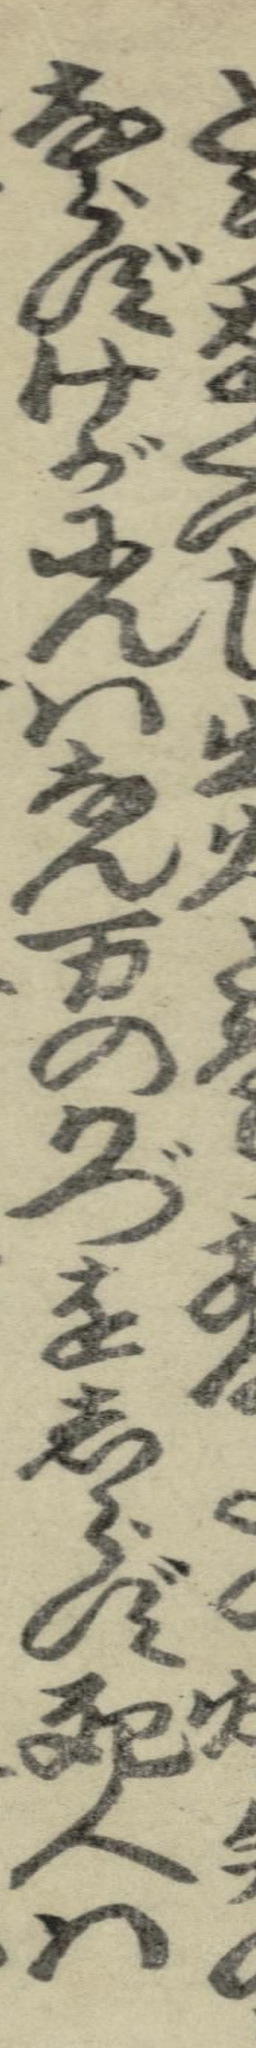ならずけがにんはなん万のかづをしらず死人は
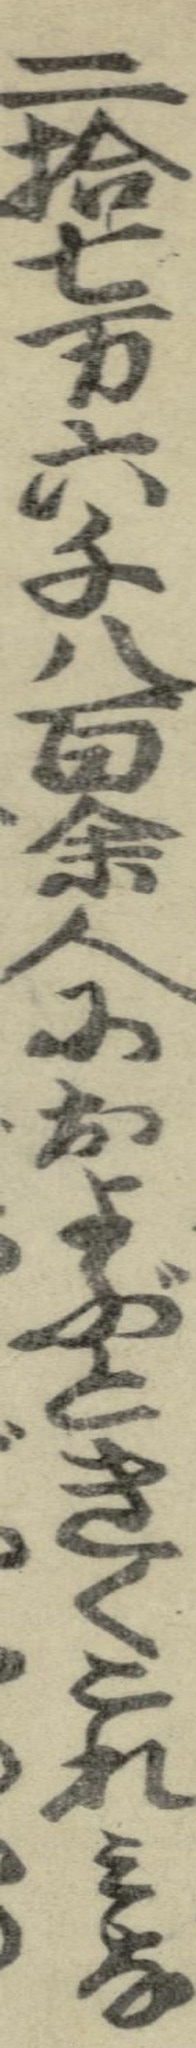二拾七万六千八百余人におよぶときくこれみな
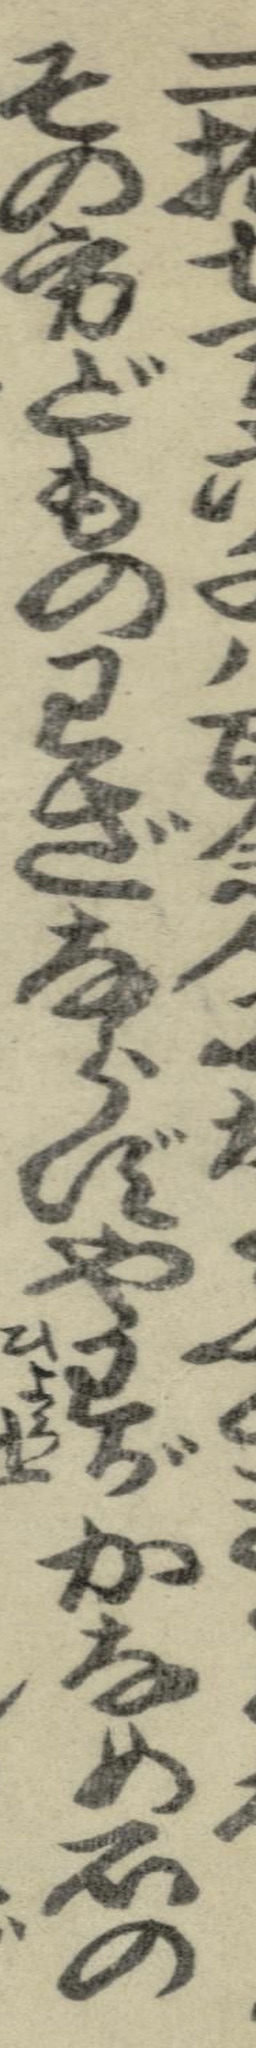その方どものわざならずやわがかなめ石の
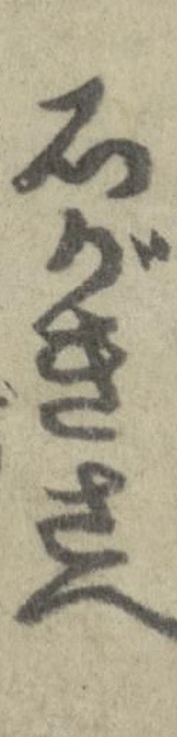石がきさへ
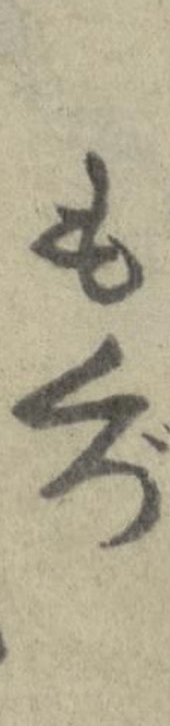もくづ
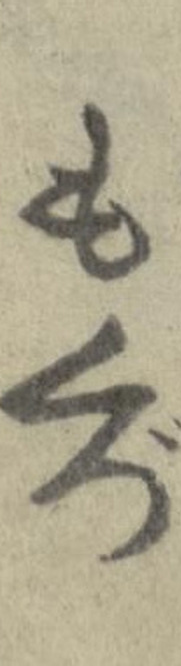もくづ
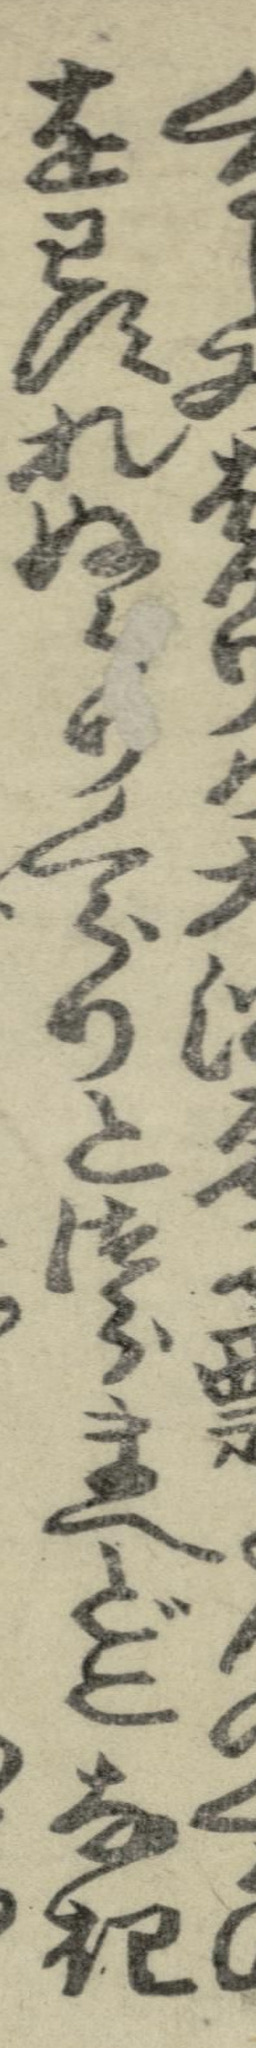をわすれぬらりくらりとつらまへどこなき
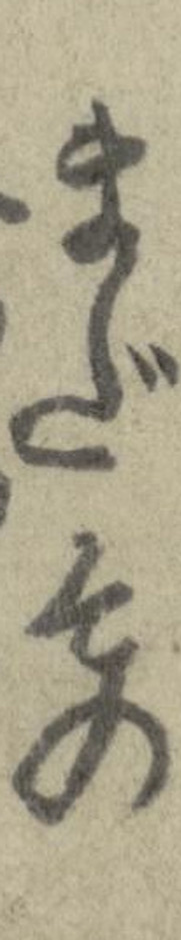まだその
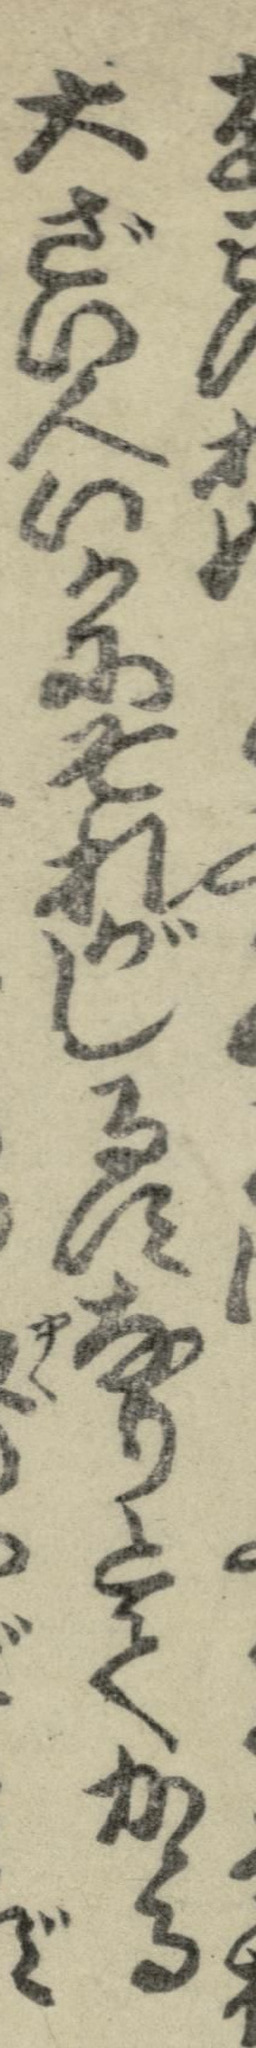大ざい人いかにそれがしるしなりとてかゝる
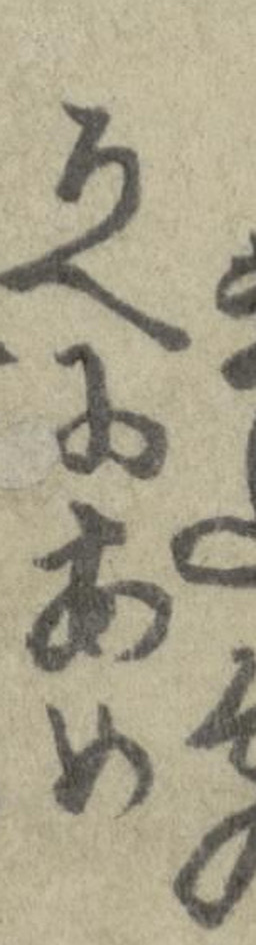うへにあめ
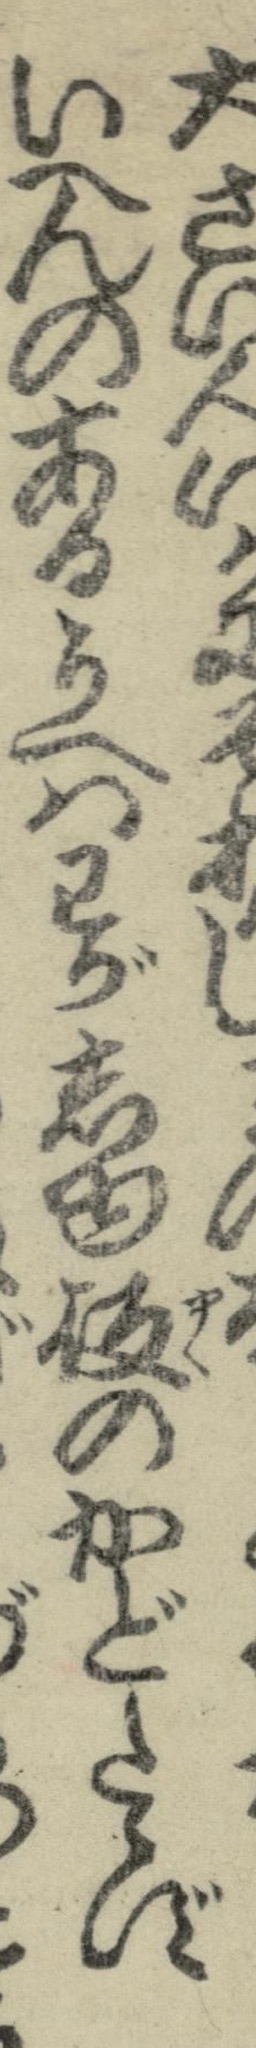いへんのあるうへはわがしゆ役のかどたゝず
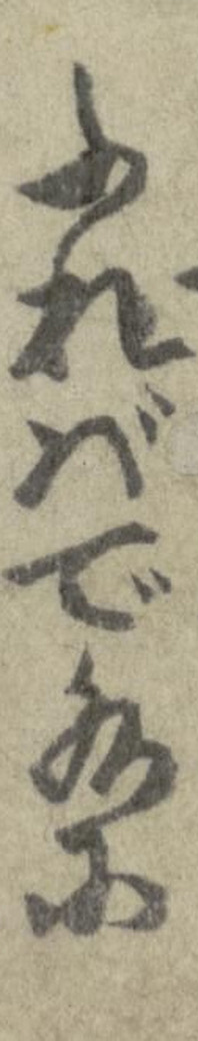ふればで水に
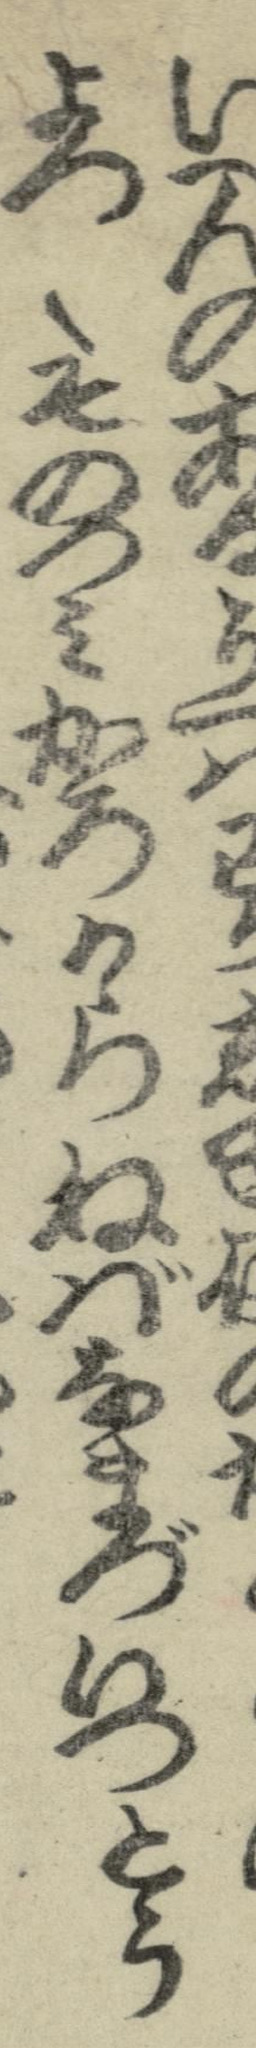よつそのつみかろからねばなまづいつとう
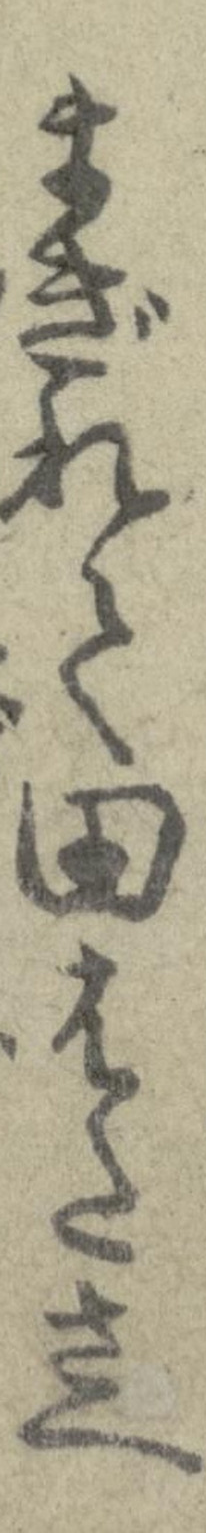まぎれて田はたさへ
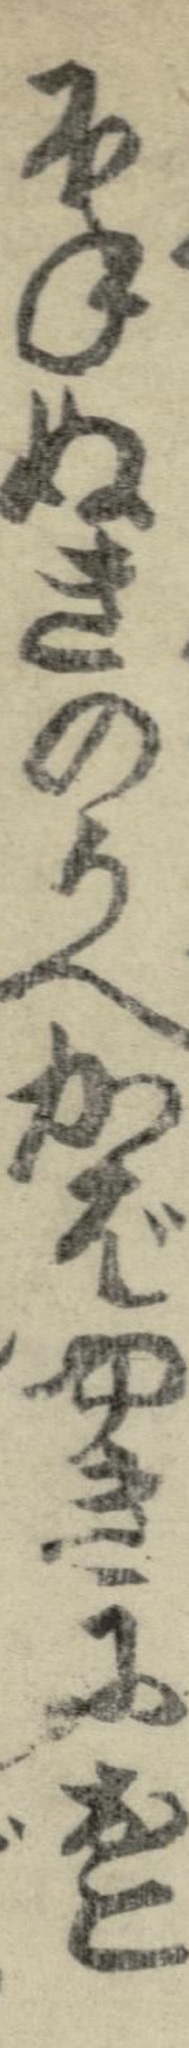ほねぬきのうへかばやきにおこ
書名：[すい神のおしえにいのちたすかりて]
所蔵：東京大学地震研究所図書室 Earthquake Research Institute Library, The University of Tokyo, JAPAN
